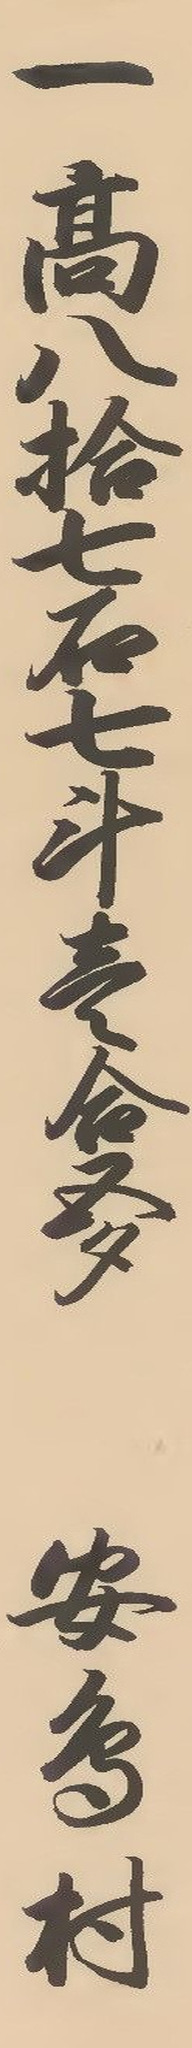一高八拾七石七斗壱合五勺安鳥村
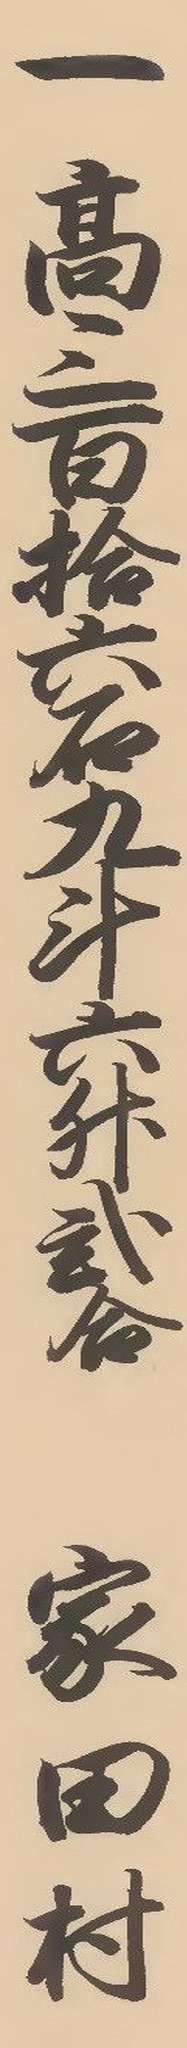一高三百拾六石九斗六升弐合家田村
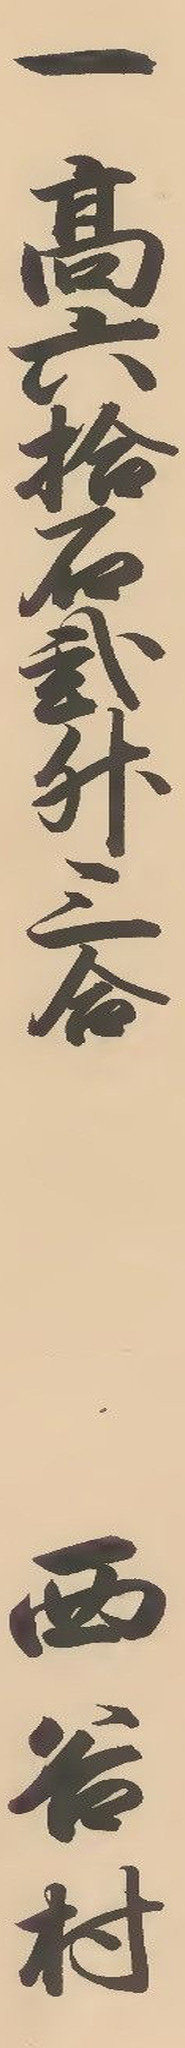一高六拾石弐升三合西谷村

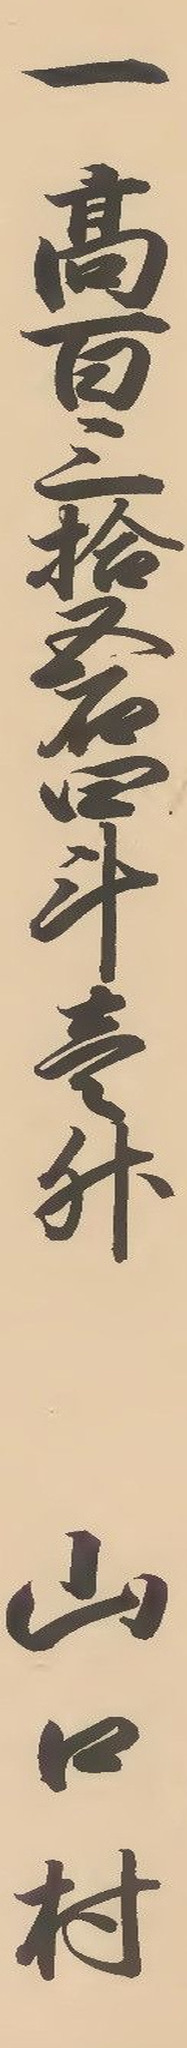一高百三拾五石四斗壱升山口村
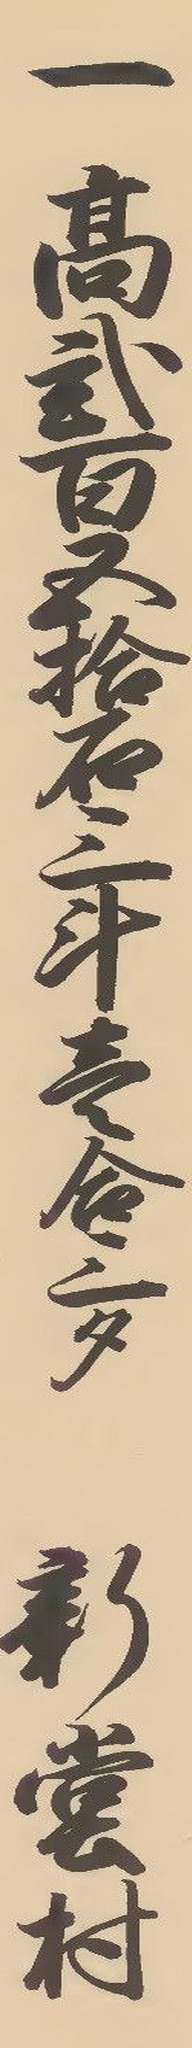一高弐百五拾石三斗壱合三勺新堂村
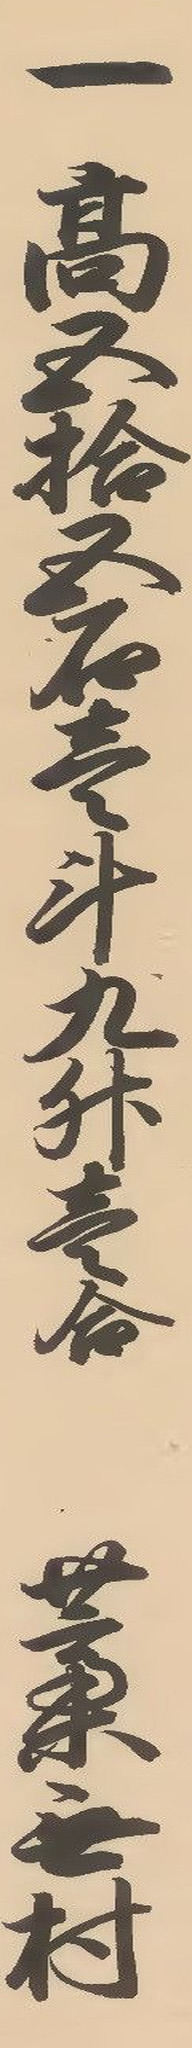一高五拾五石壱斗九升壱合藁無村
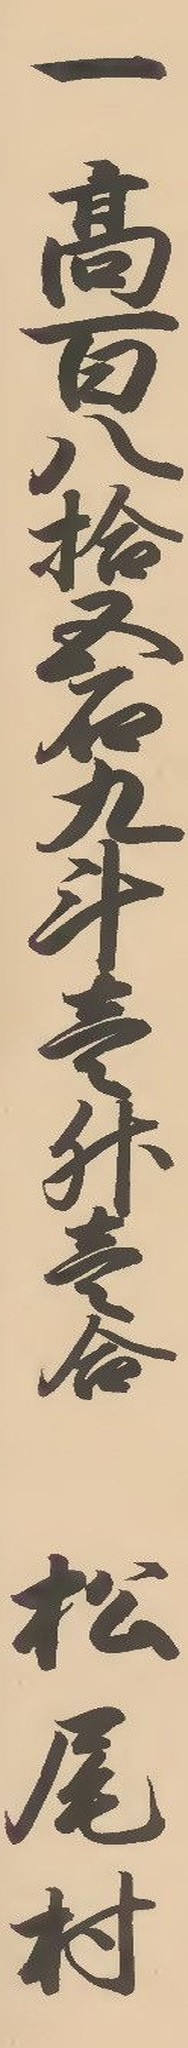一高百八拾五石九斗壱升壱合松尾村
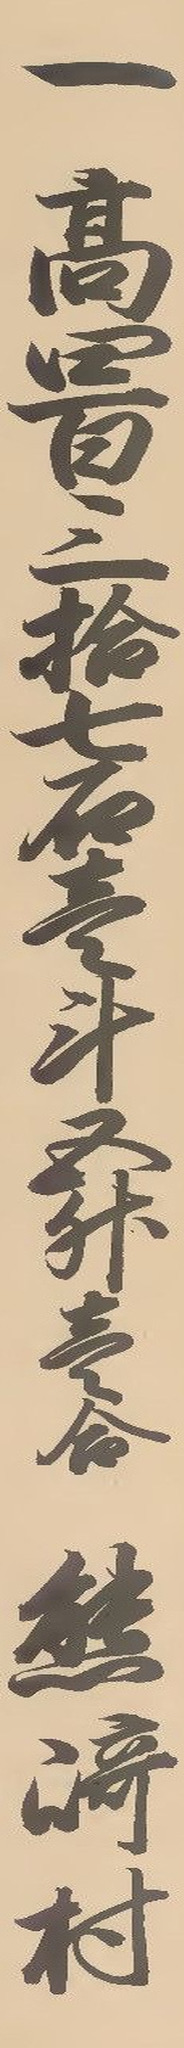一高四百三拾七石壱斗五升壱合熊崎村
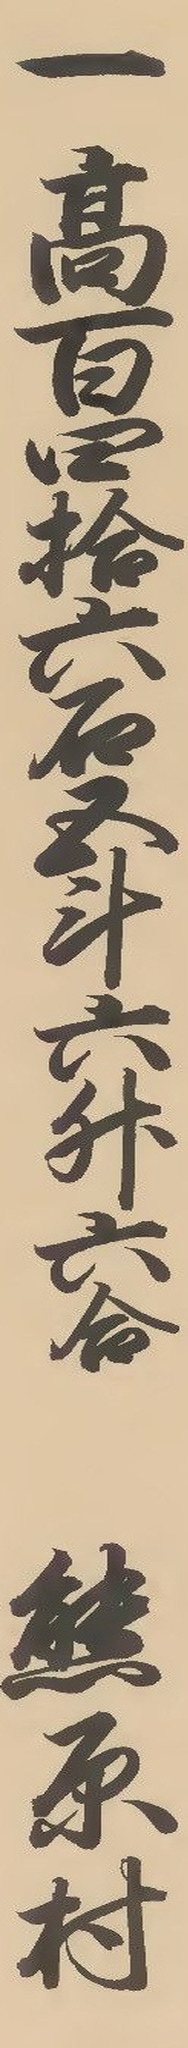一高百四拾六石五斗六升六合熊原村
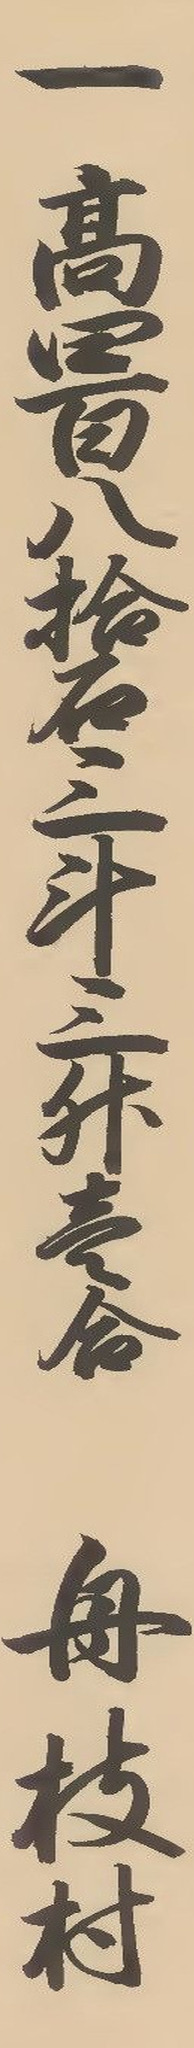一高四百八拾石三斗三升壱合舟枝村
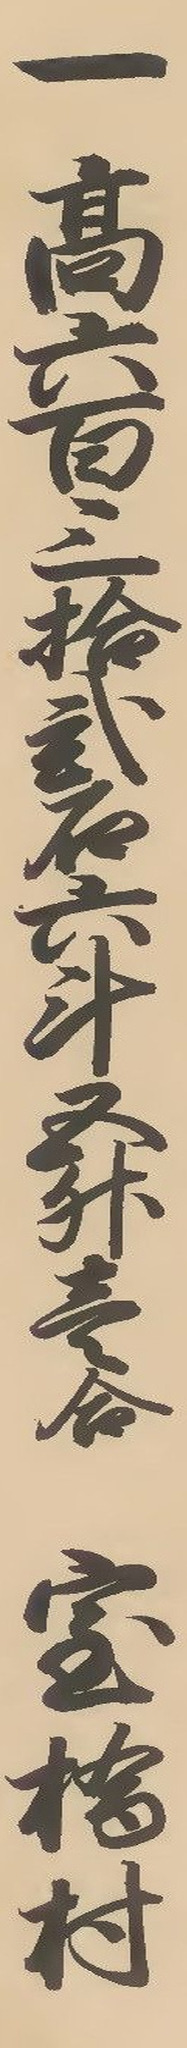一高六百三拾弐石六斗五升壱合室橋村

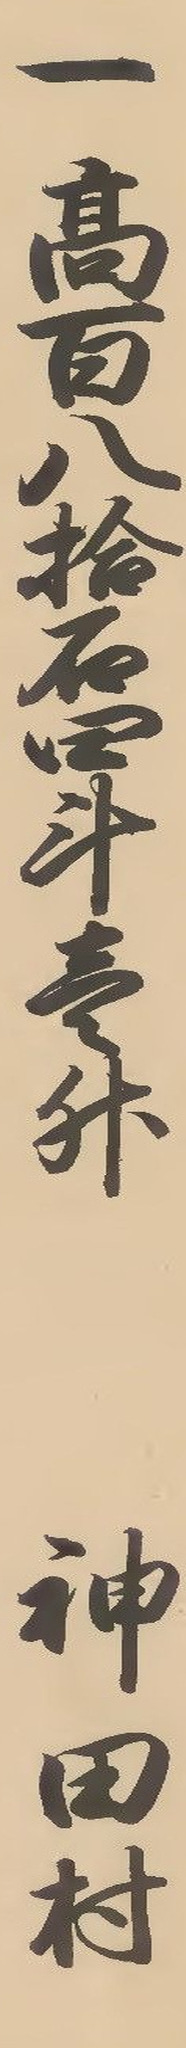一高百八拾石四斗壱升神田村
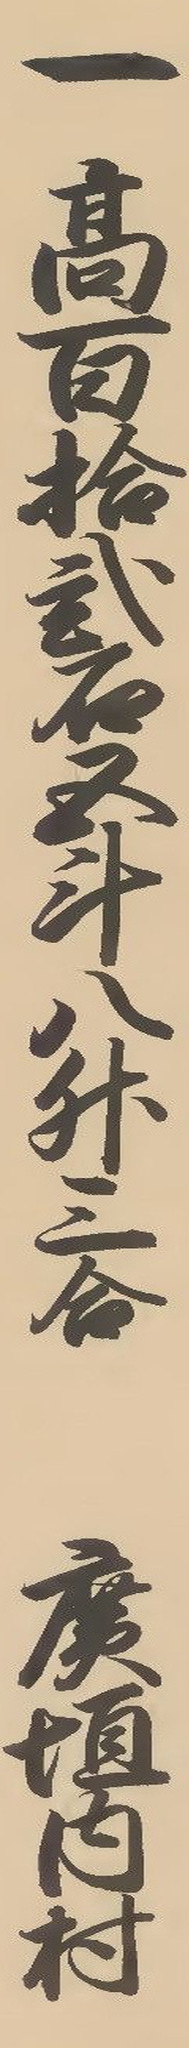一高百拾弐石五斗八升三合広垣内村
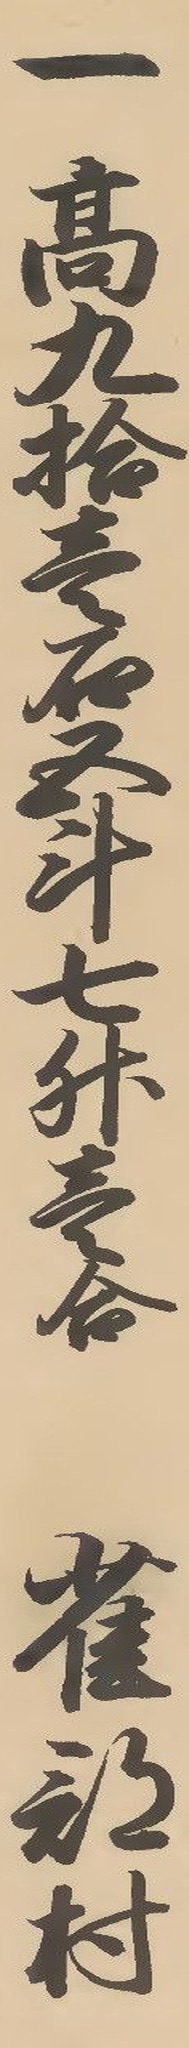一高九拾壱石五斗七升壱合雀部村
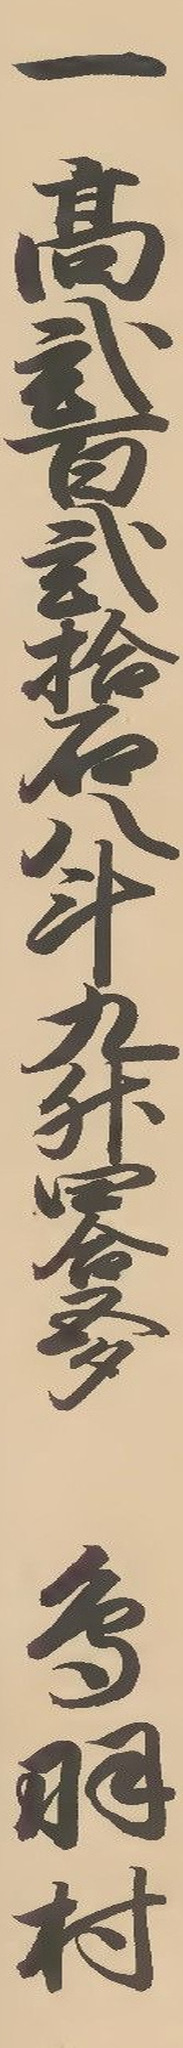一高弐百弐拾石八斗九升四合五勺鳥羽村
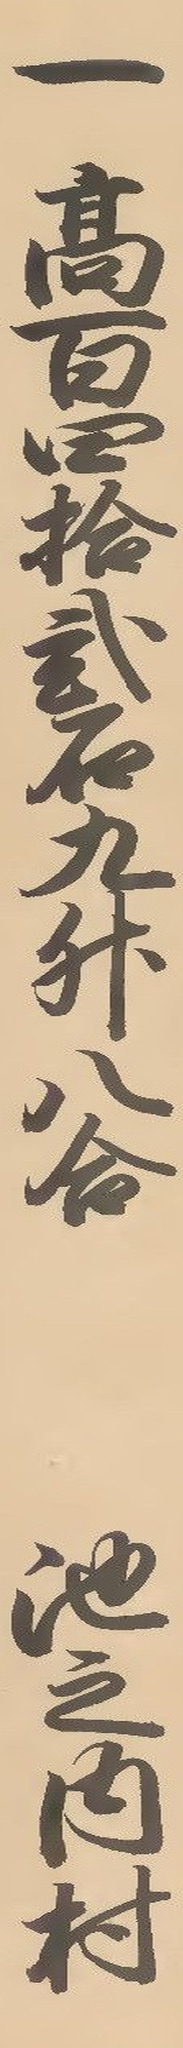一高百四拾弐石九升八合池之内村
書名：丹波国郷帳
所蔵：国立公文書館 National Archives of Japan
